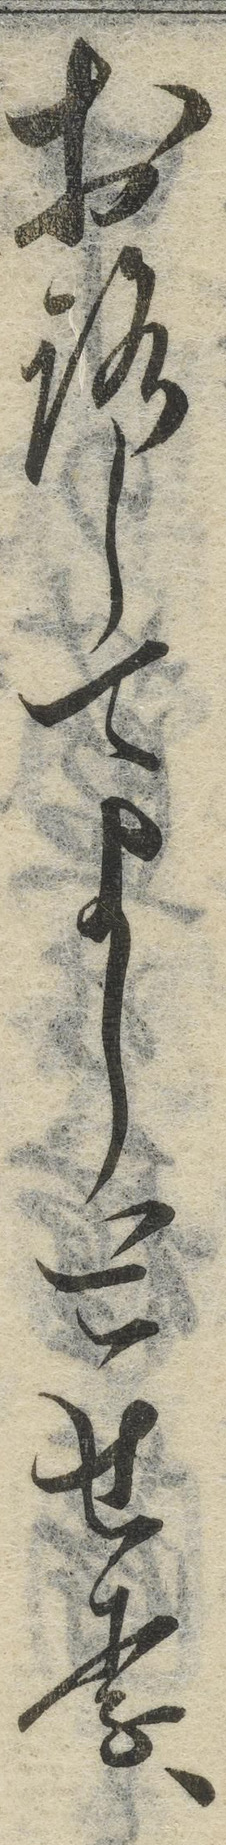おろしてよしとせり、
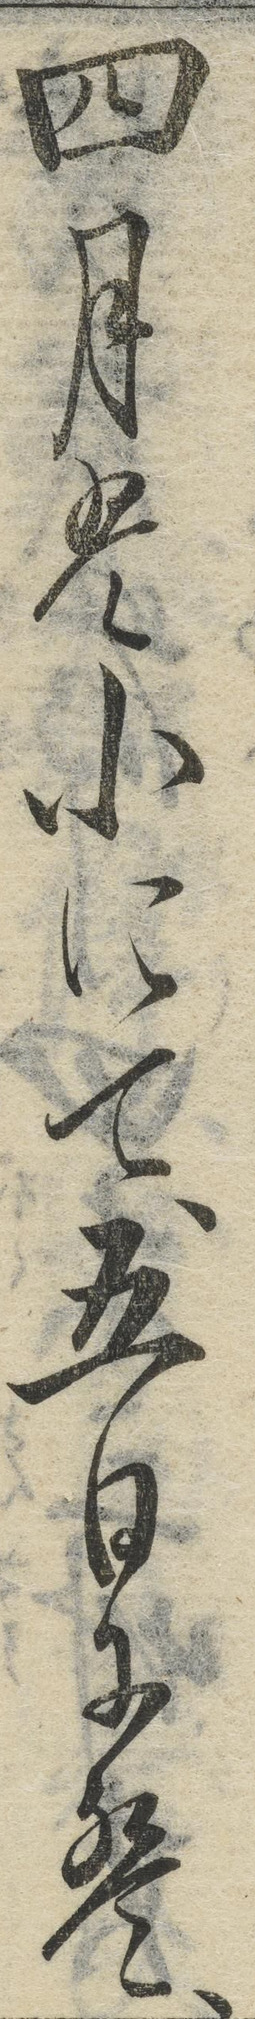四月は小にて、五日には、
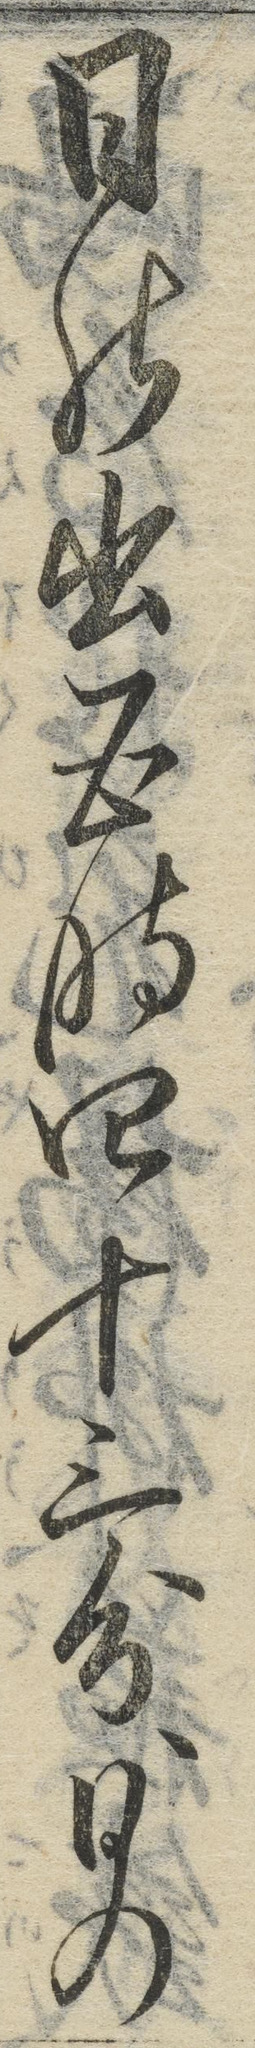日の出五時四十三分、日の
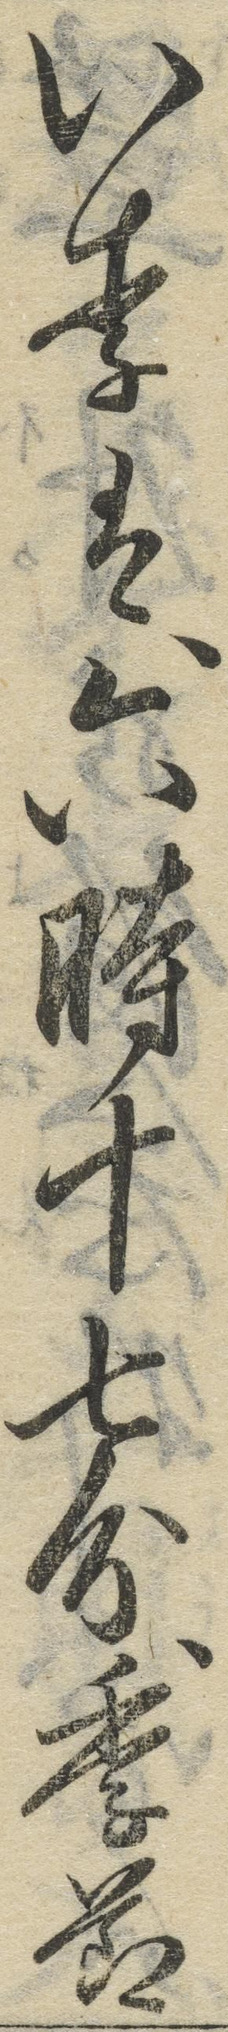いりは、六時十七分、季節
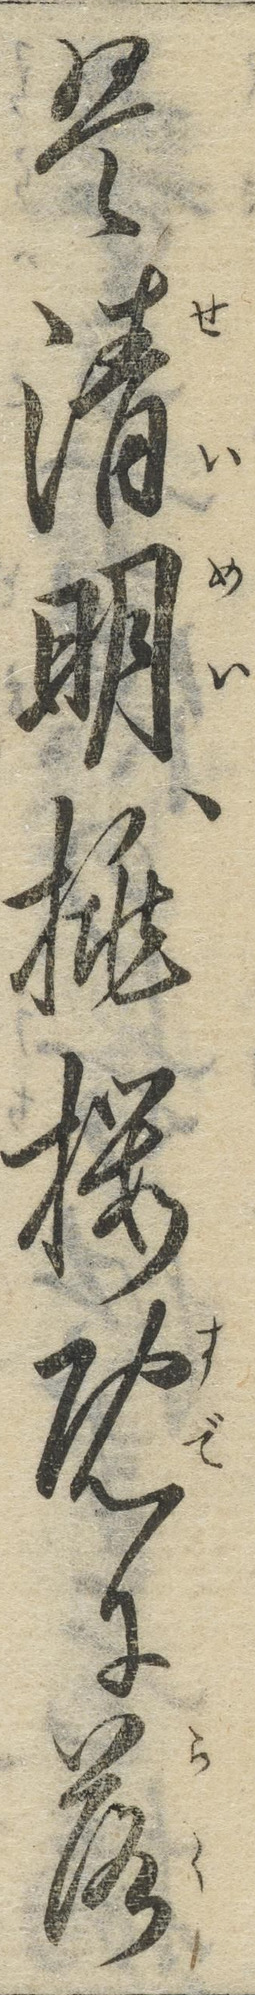は清明、桃桜既に落
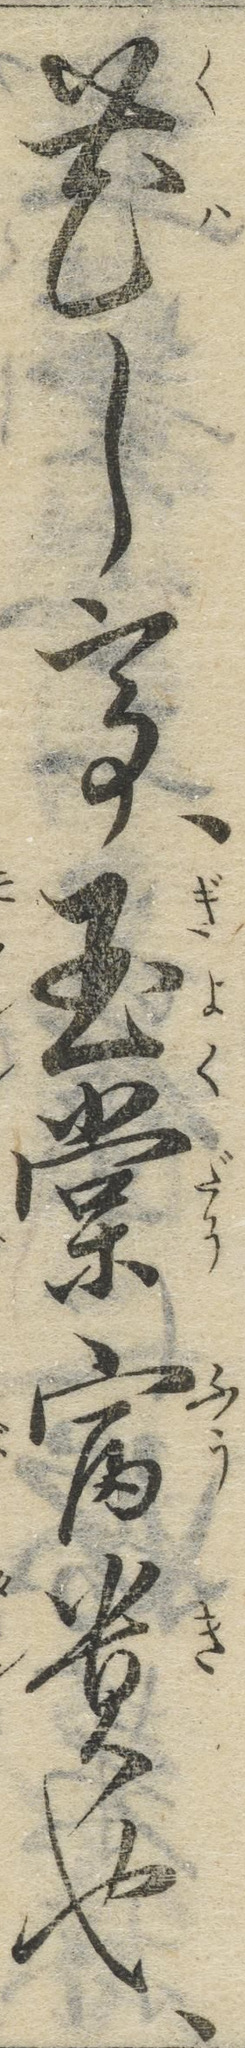花して、玉棠富貴や、
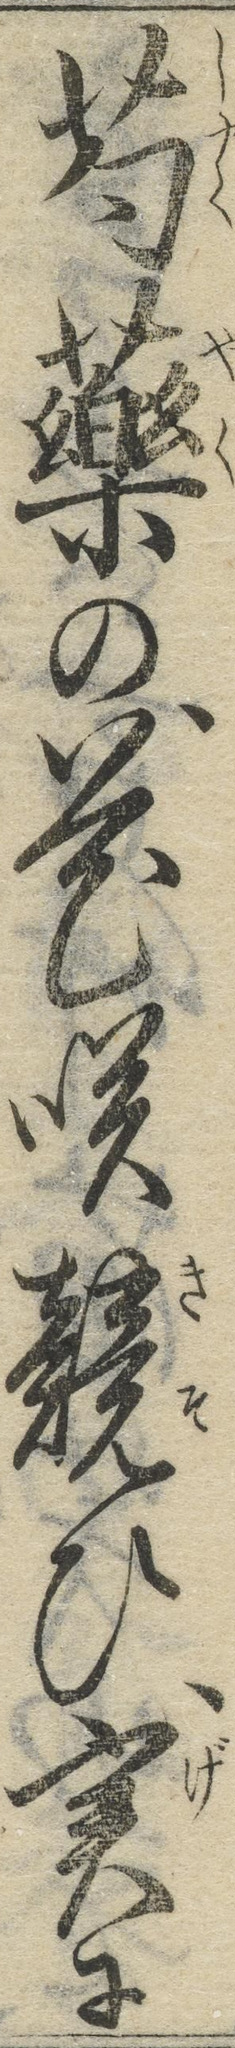芍薬の、花咲競ひ、実に

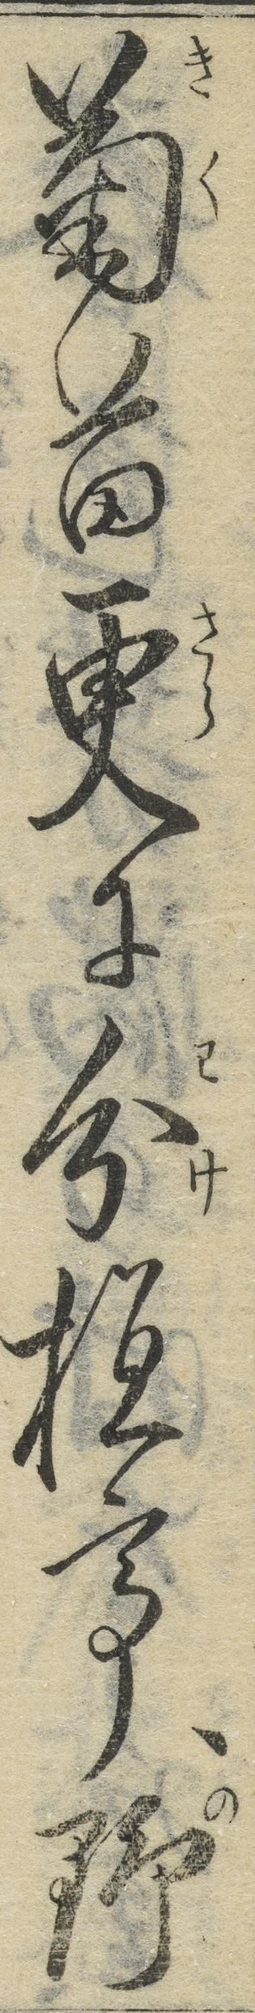菊苗更に分植て、野
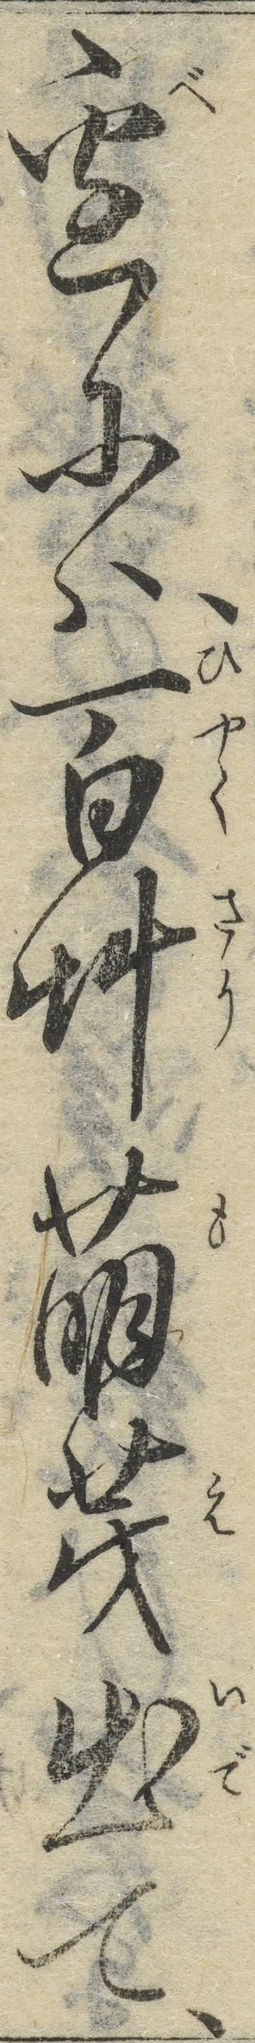辺には、百草萌茂出て、
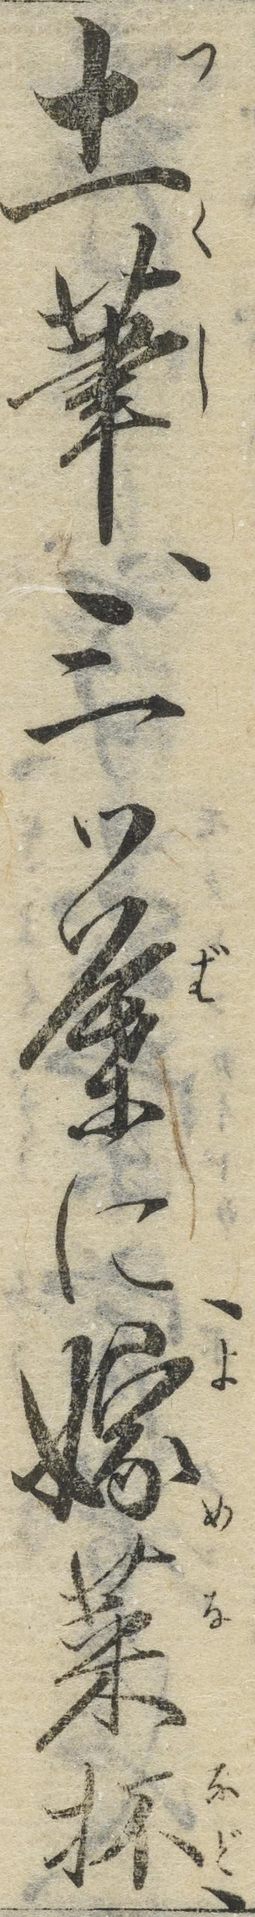土筆、三ツ葉に、嫁菜抔、
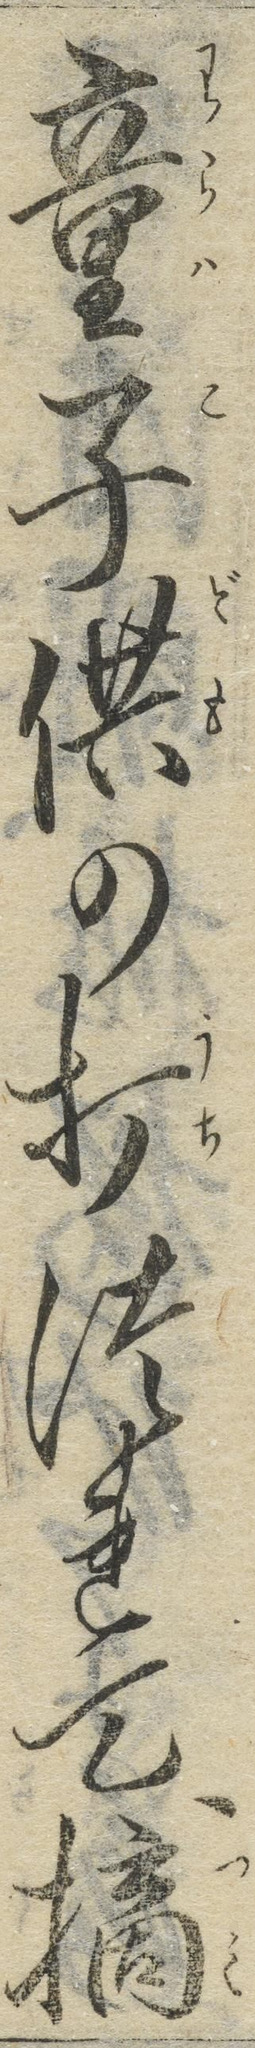童子供の打つれて、摘
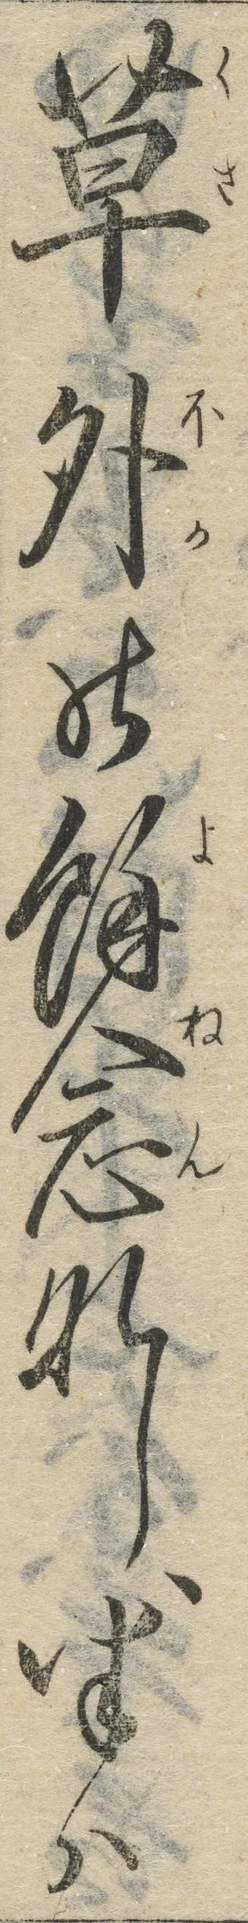草外の余念なし、半は
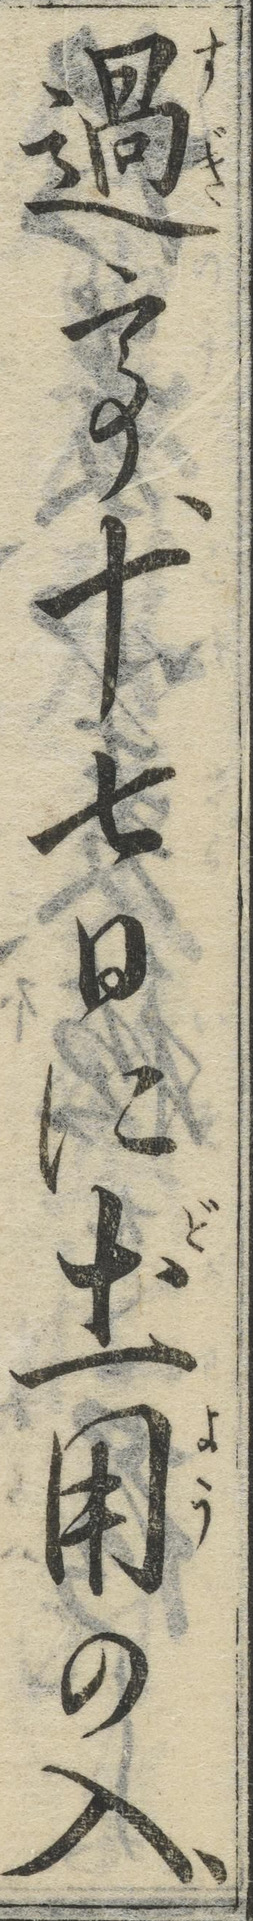過て、十七日に土用の入、
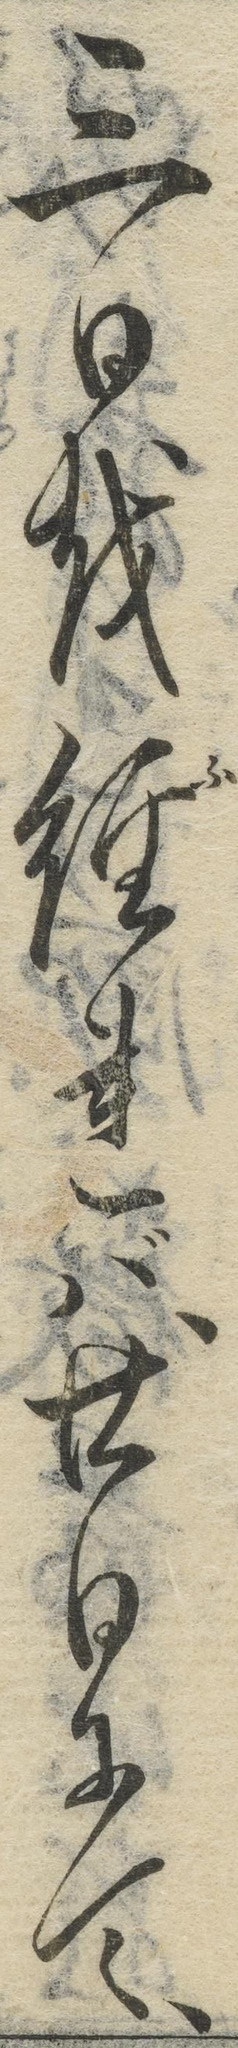三日を経れば、廿日にて、
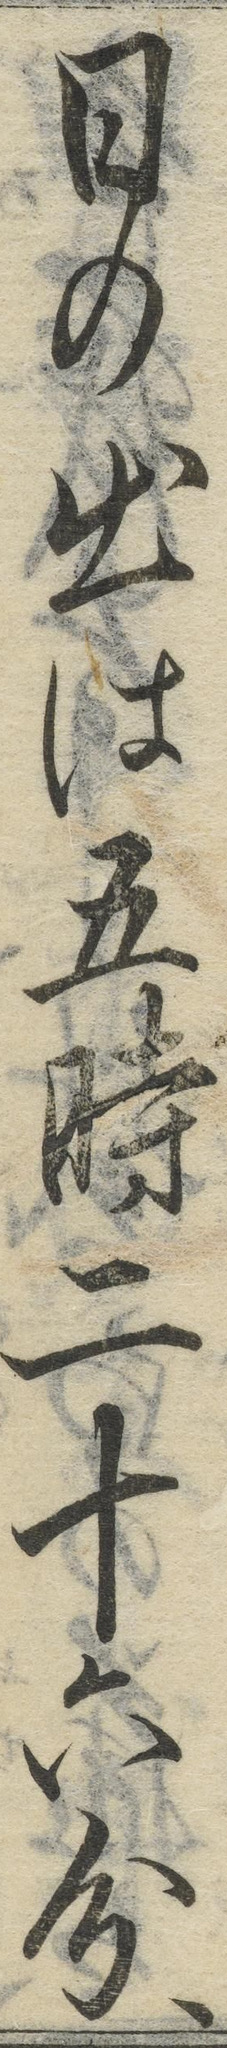日の出は五時二十六分、
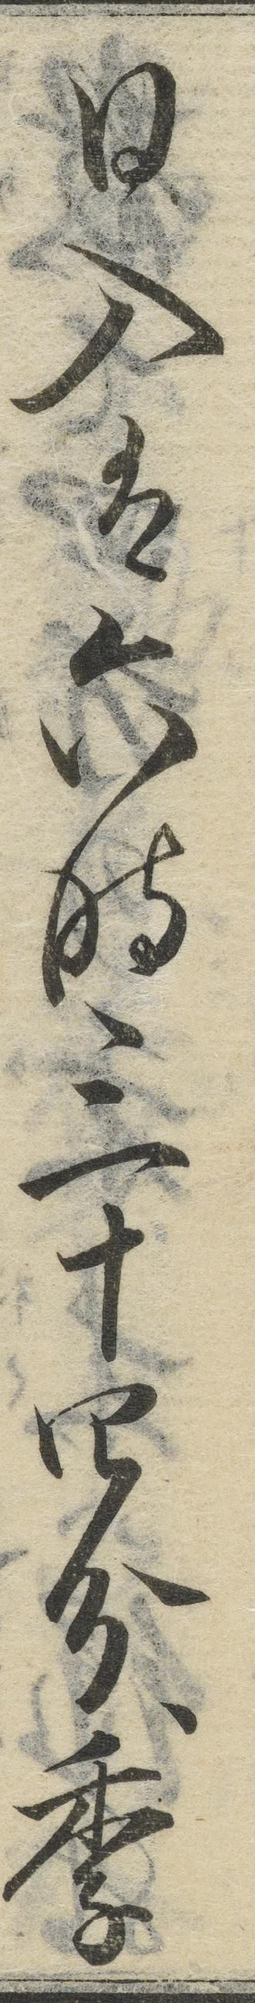日入は六時三十四分、季
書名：暦日往来　單
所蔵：東京大学地震研究所図書室 Earthquake Research Institute Library, The University of Tokyo, JAPAN
